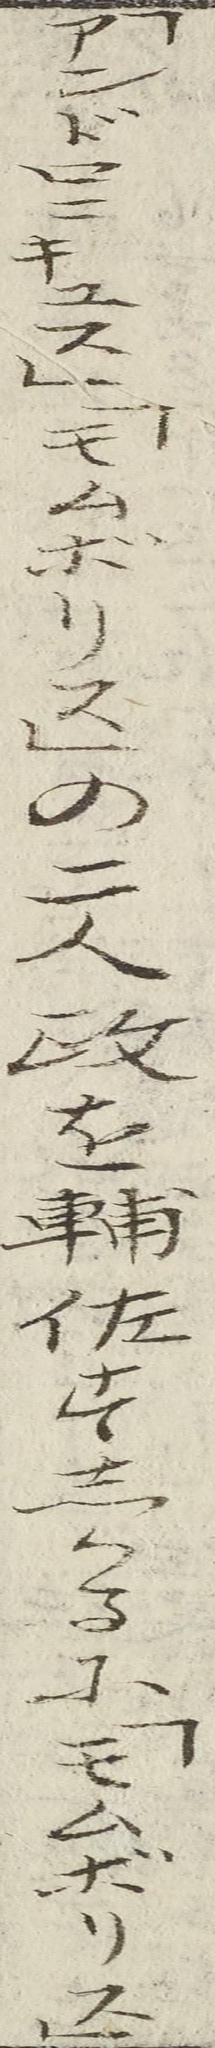「アンドロ二キュス」「モムボリス」の二人政を補佐すしかるに「モムボリス」
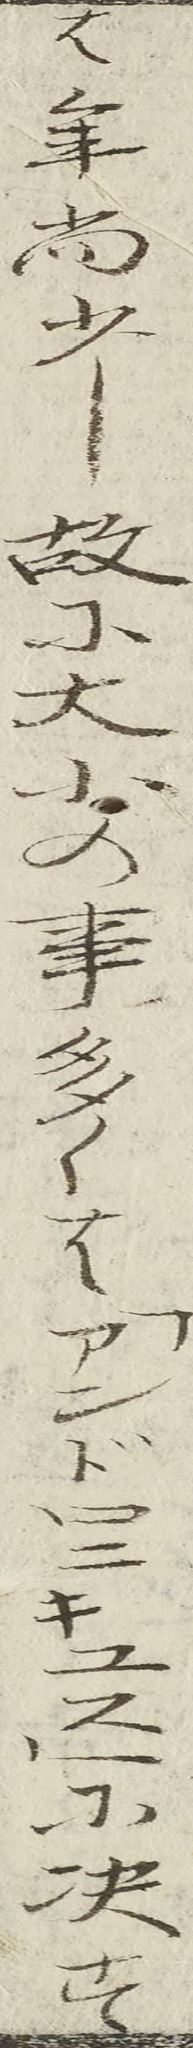は年尚少し故に大小の事多くは「アドロ二キユス」に决す
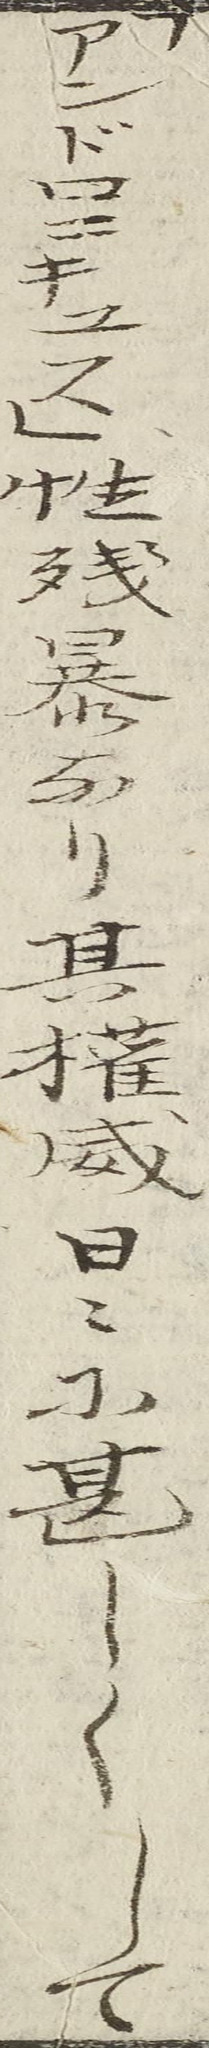「アドロ二キユス」性残暴なりその権威日々甚しくして
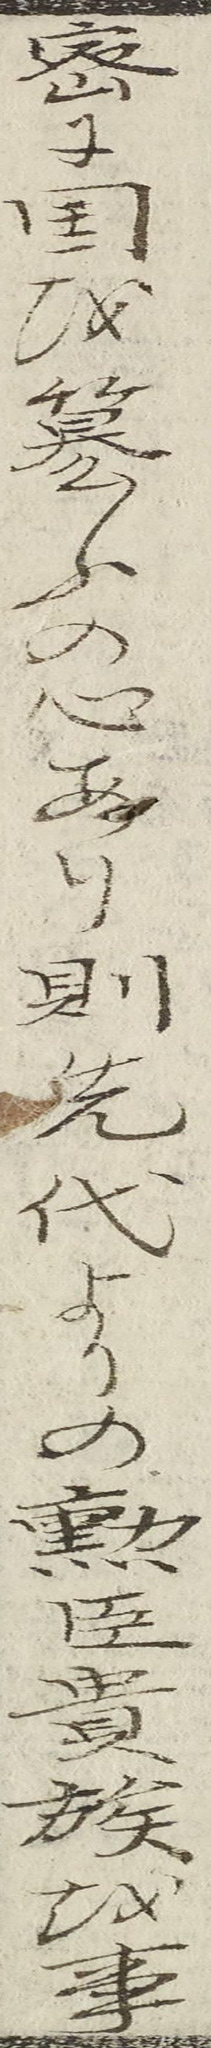密の国を簒ふの心あり則先代よりの勲臣貴族を事
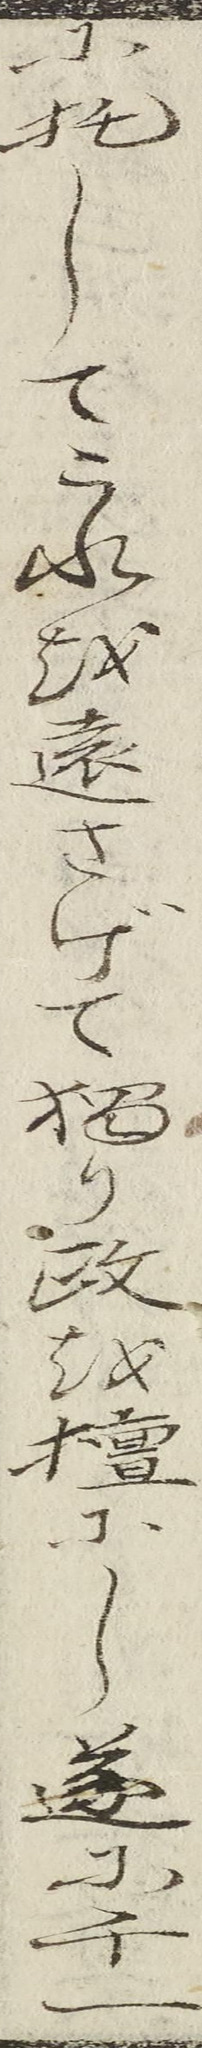に托してこれを遠さげて独り政を檀にし遂に千一
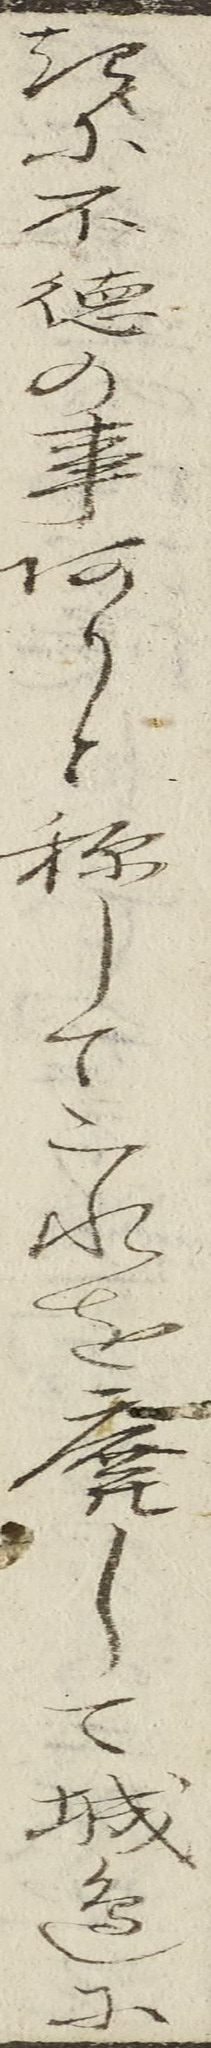きに不徳の事ありと称してこれを廃して城辺に
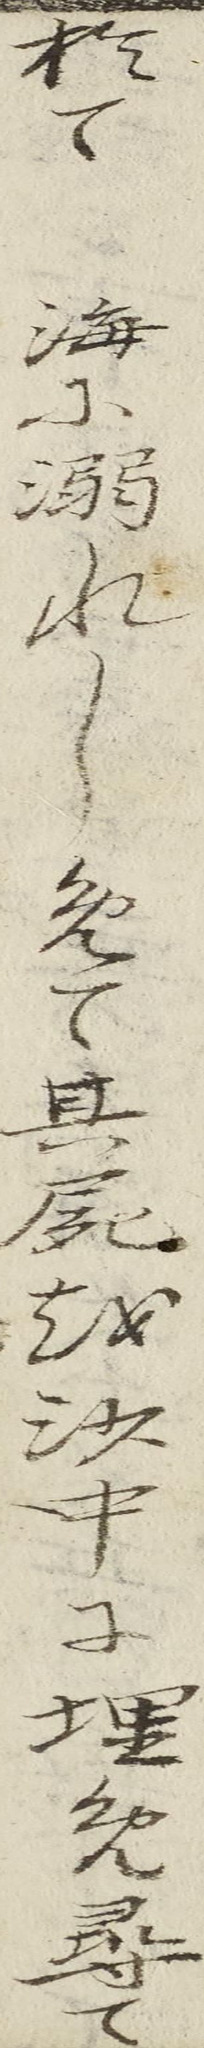於て海に溺れしめて其屍を沙中に埋め尋て
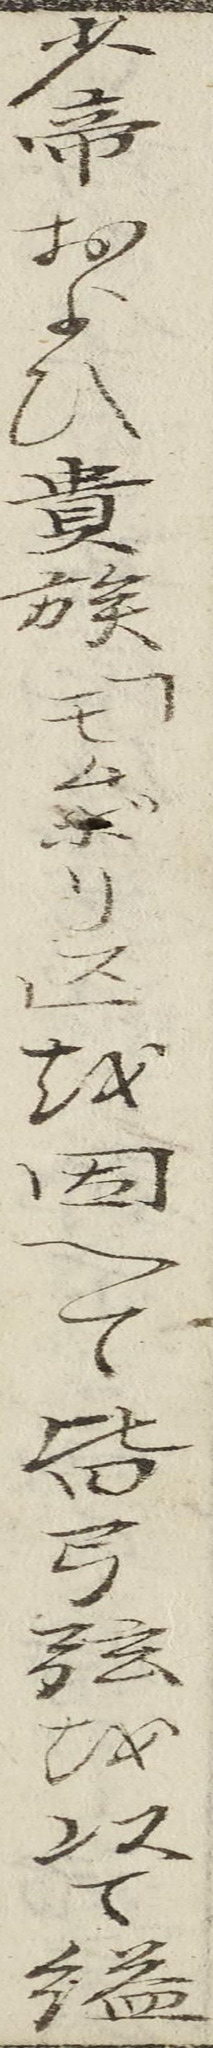少帝およひき続「モムボリス」を因へて皆弓弦を以て縊
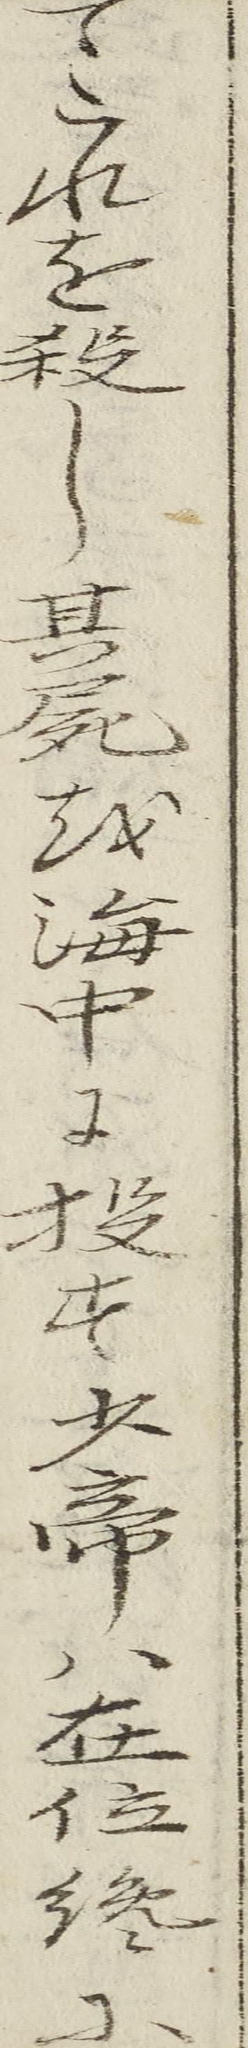てこれを殺し其屍を海中に投す少帝ハ在位纔に
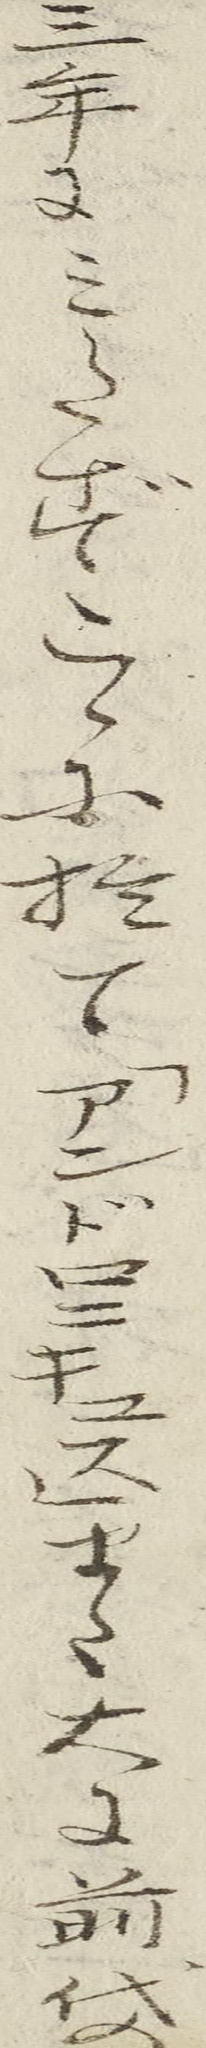三年にミたずこゝに於て「アドロ二キユス」また大に前代の
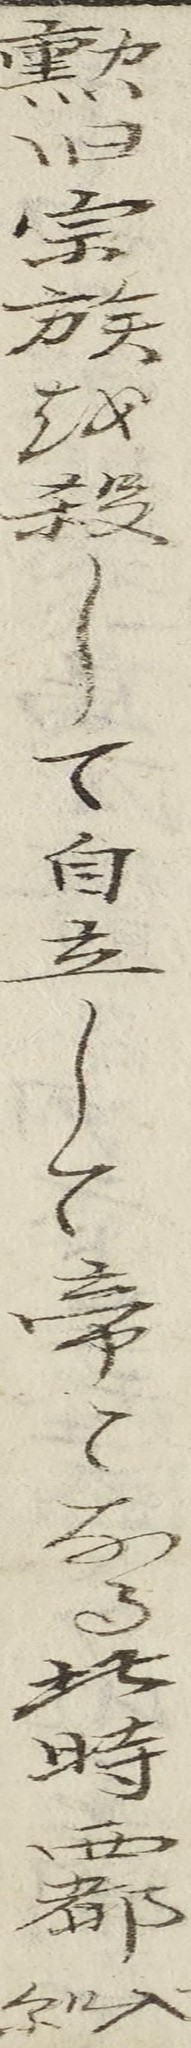勲旧宗族を殺して自立して帝となる此時帝都入尓
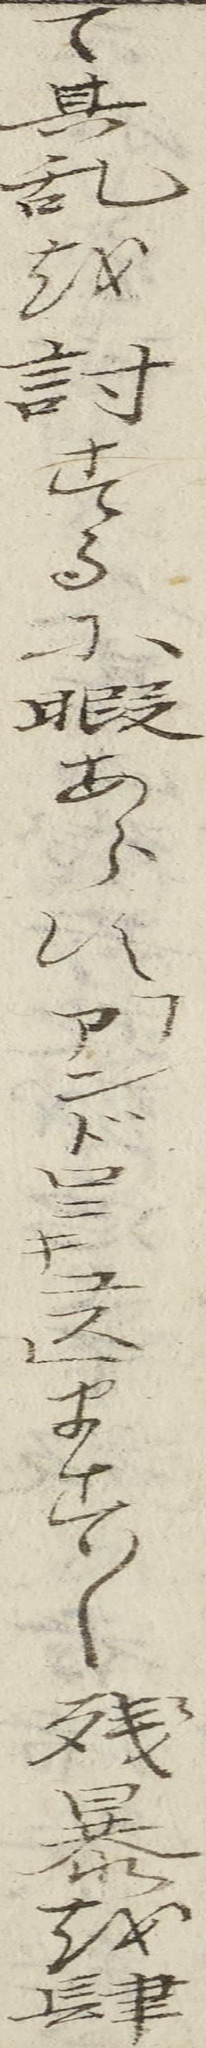て其乱を討するに暇あらす「アドロ二キユス」ます〳〵残暴を肆
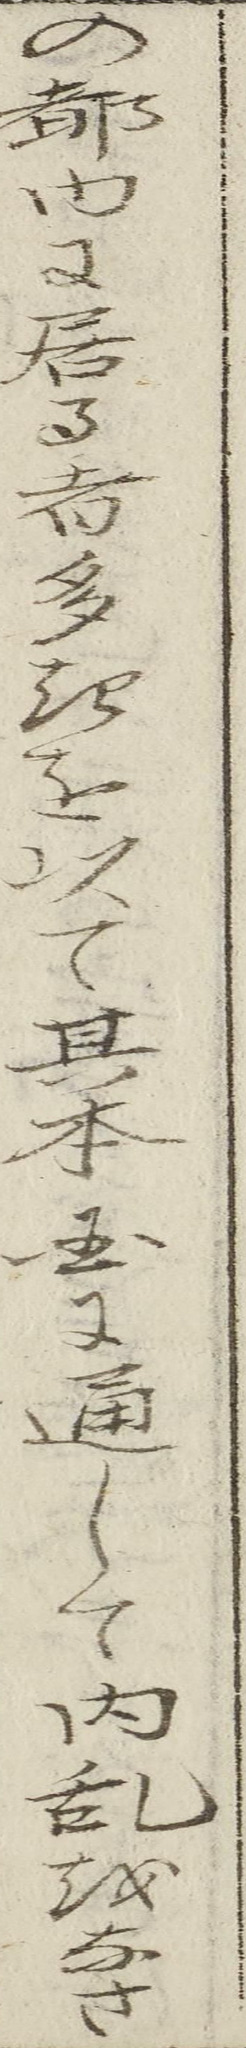の都内に居る者多きを以て其本国に通して内乱をなさ
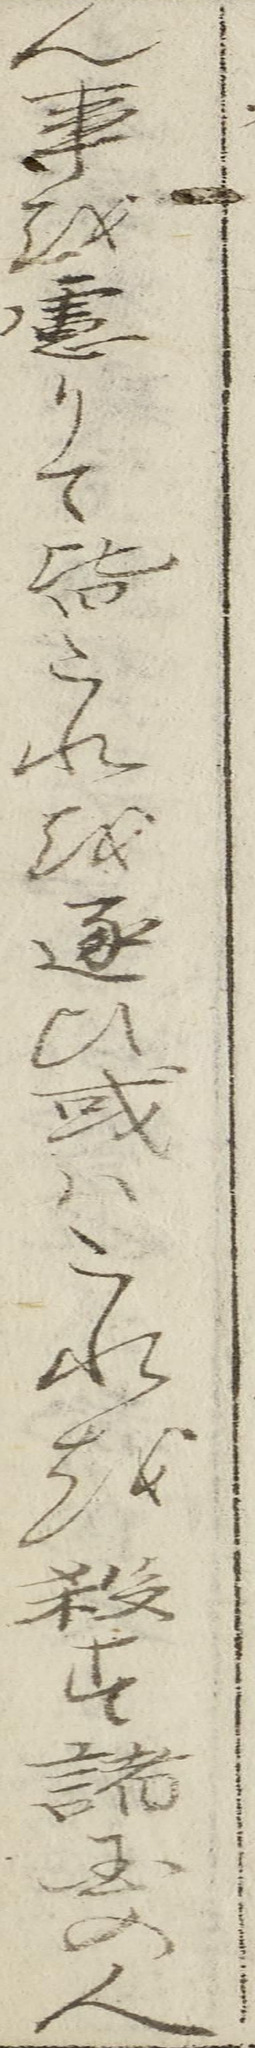ん事を憂りて皆是を逐ひ或ハこれを殺す諸国の人

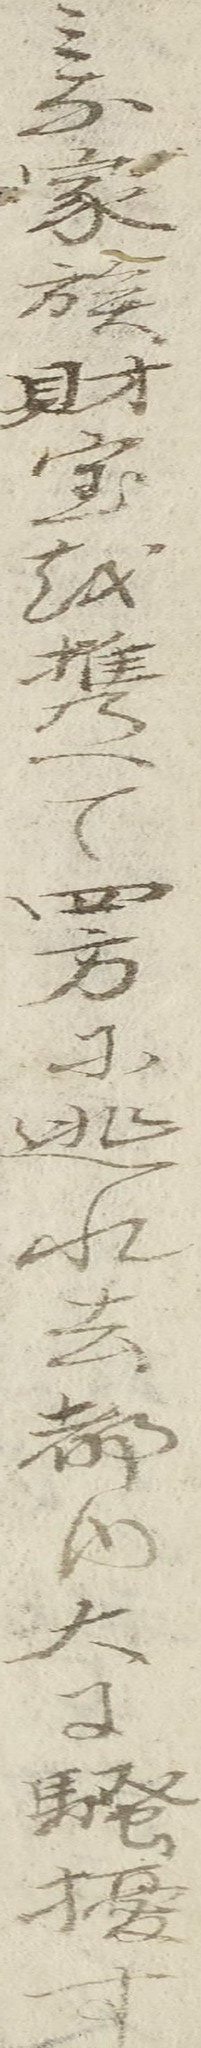ミな家族財宝を携へて四方に逃れ去都内大に騒擾す
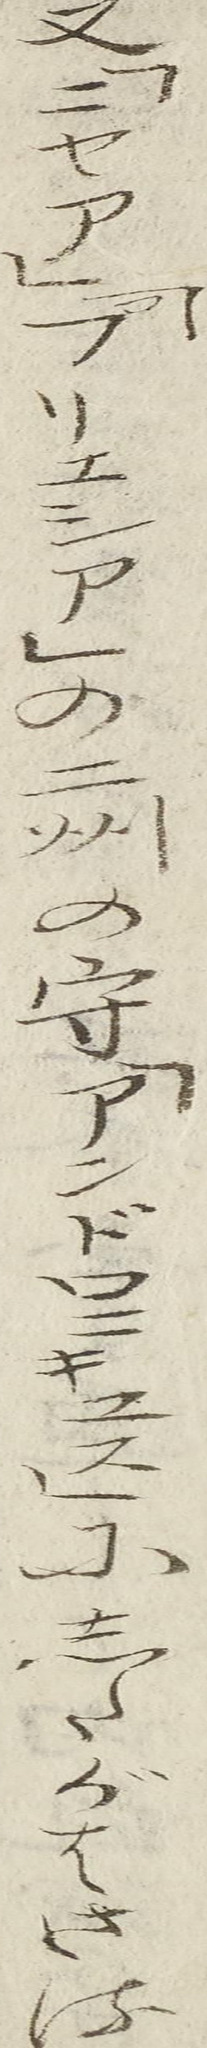又「二セア」「プリエシア」の二州の守「アンドロ二キュス」にしたわはさる
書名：西洋雜記　乾
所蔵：東京大学地震研究所図書室 Earthquake Research Institute Library, The University of Tokyo, JAPAN
